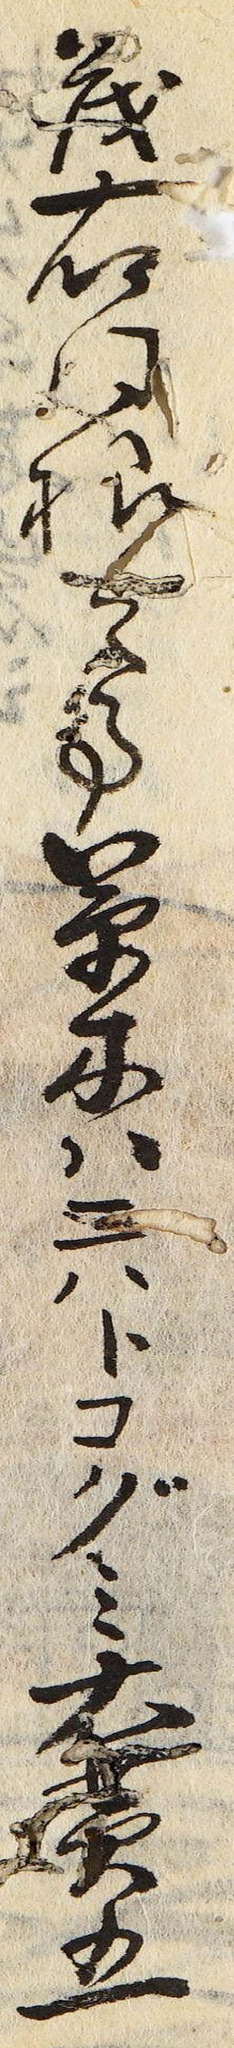も右同様之事草木ハニハトコグミ大英五
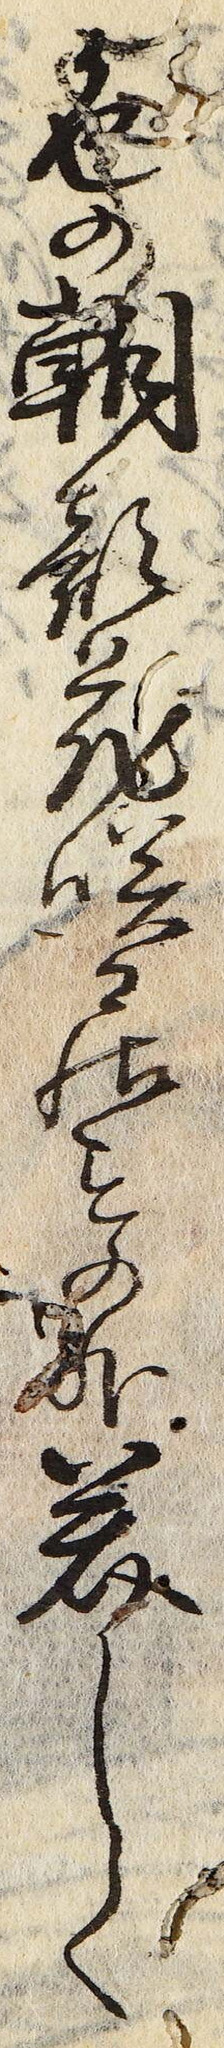色の朝顔花咲居ことの外美しく
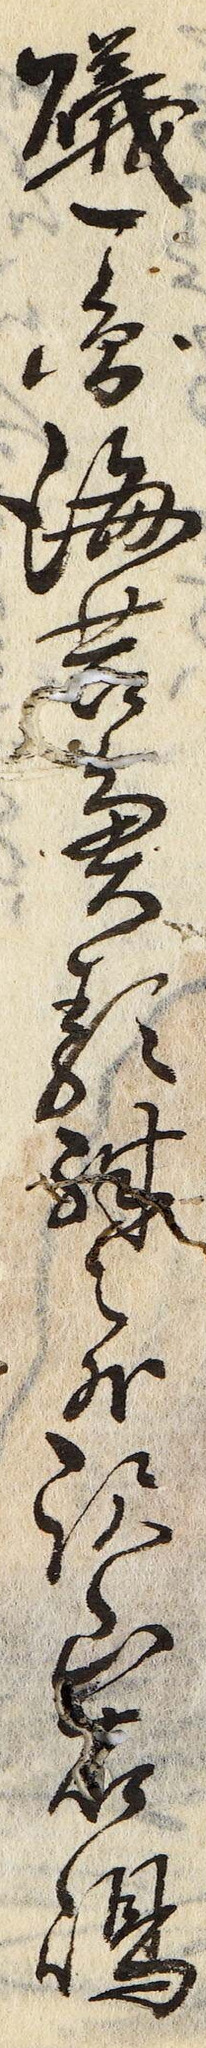磯一円海苔魚類殊之外沢山嶋
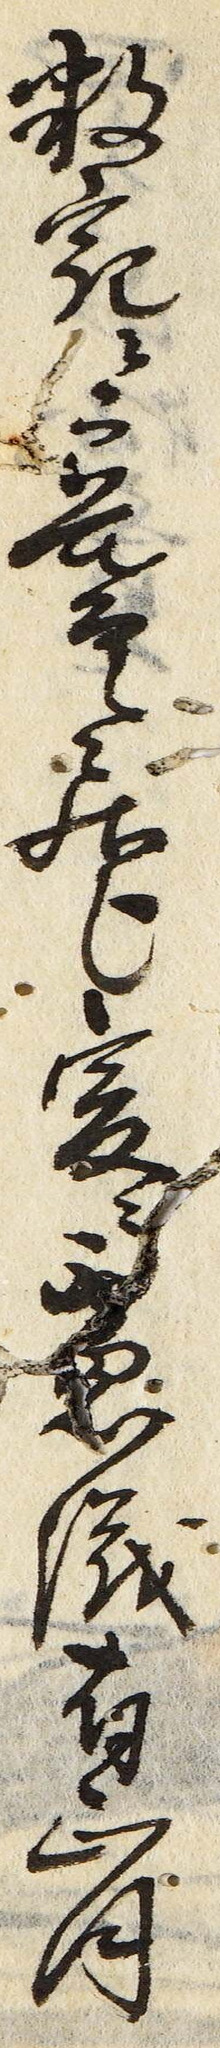枚宛ニ而暮し居申候爰ニ不思儀有正月
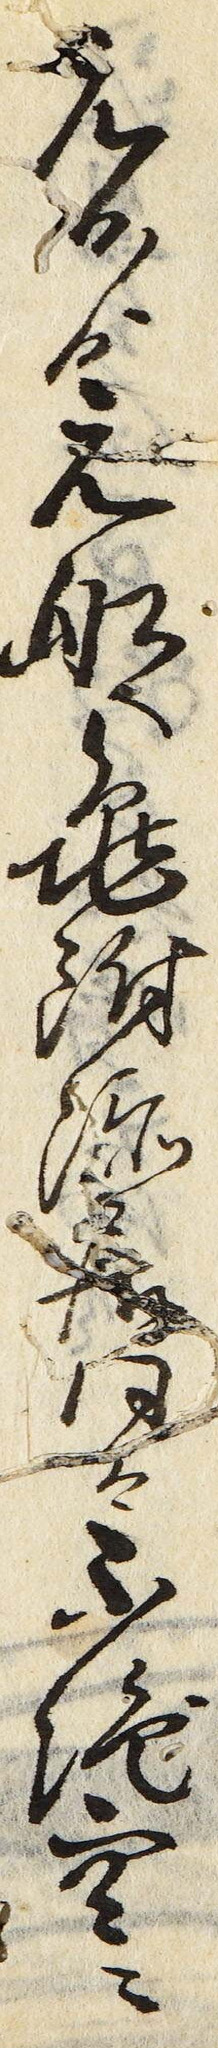元日ゟ元船へ亀付添居日々不絶空ニ
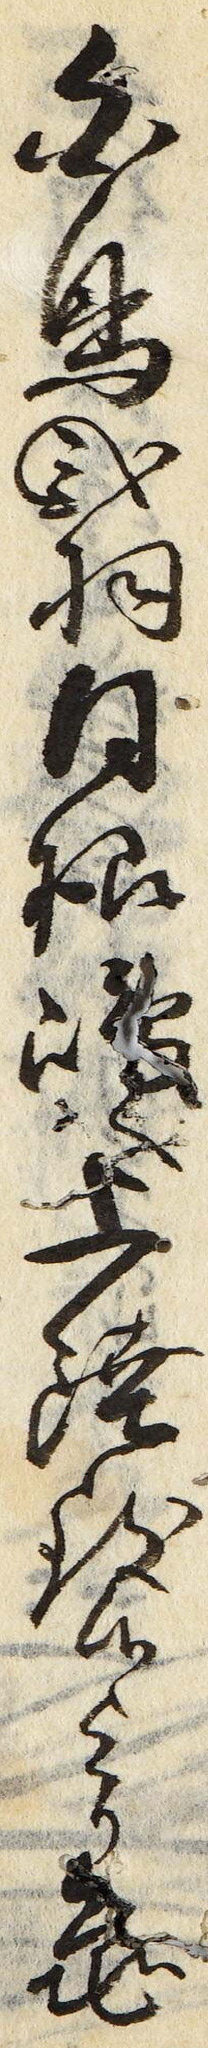白鳥弐羽同様嶋へ上陸致候より亀
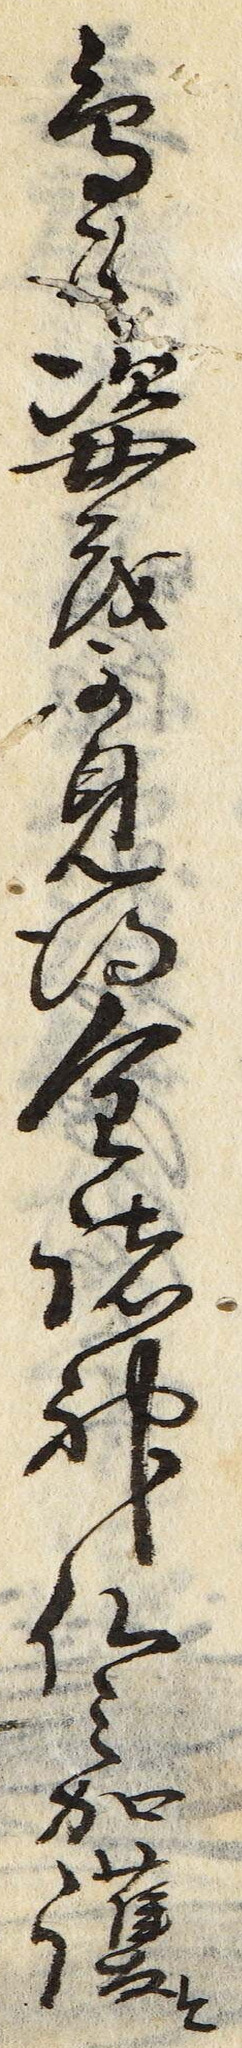鳥之姿も不見得全諸神仏之加護と
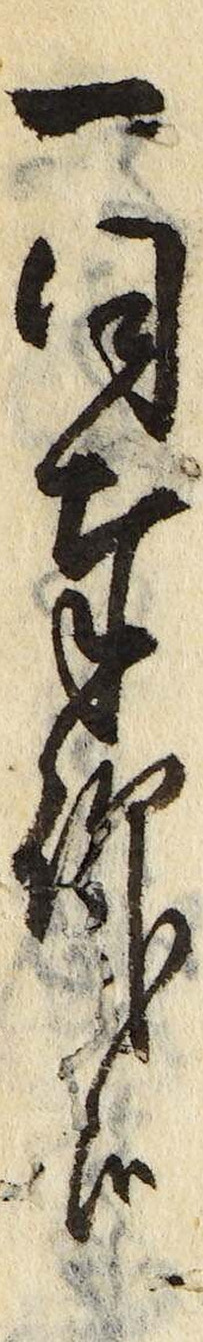一同奉仰候

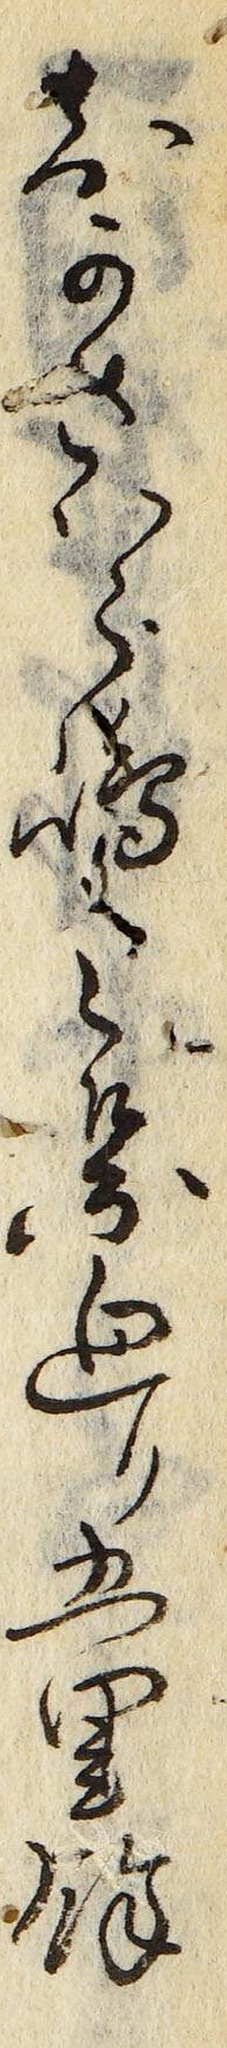おかさハら嶋之図廻り五里余
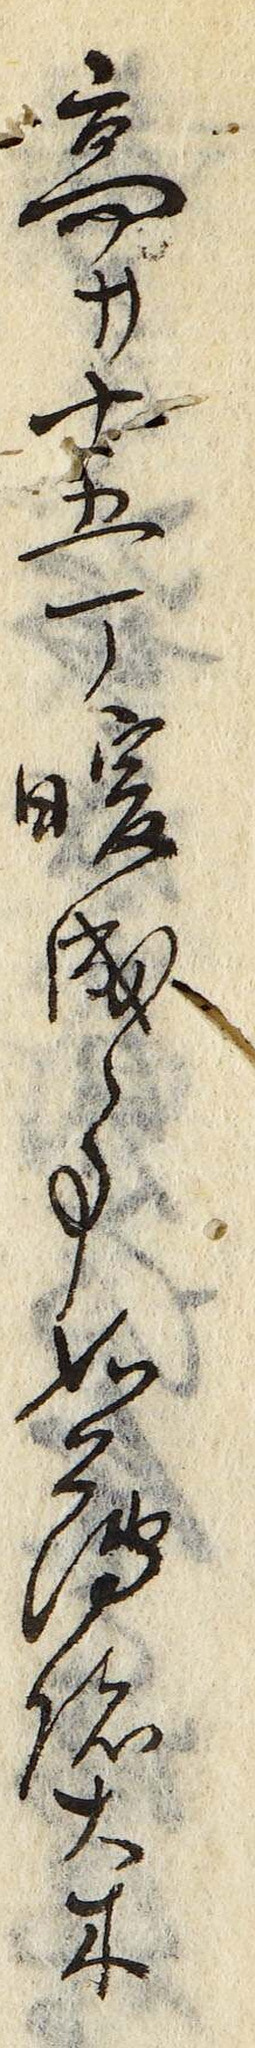高サ十五丁暖成事如薄諸大木
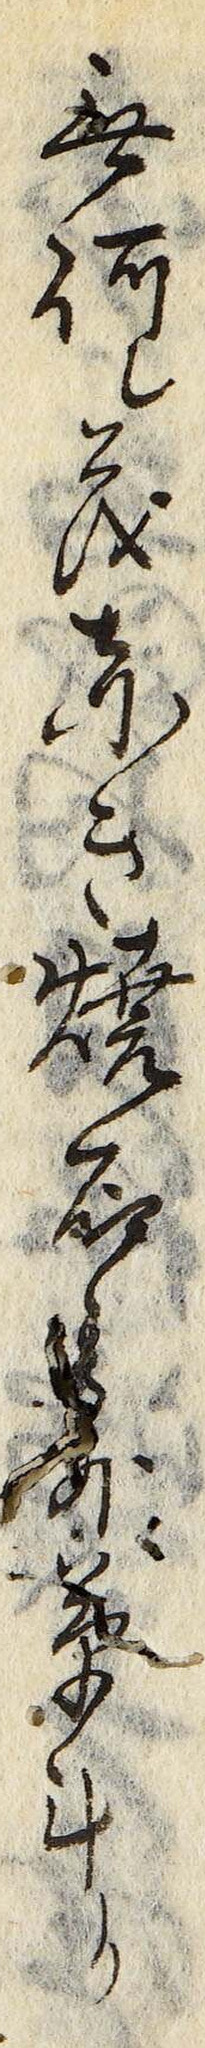無何レも赤き焼石之外ニ草計り
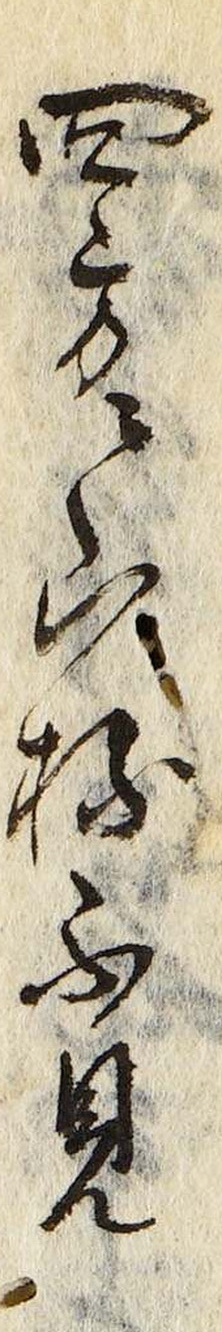四方ニ山抔不見
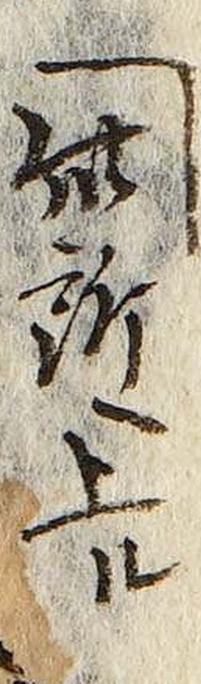此所へ上ル
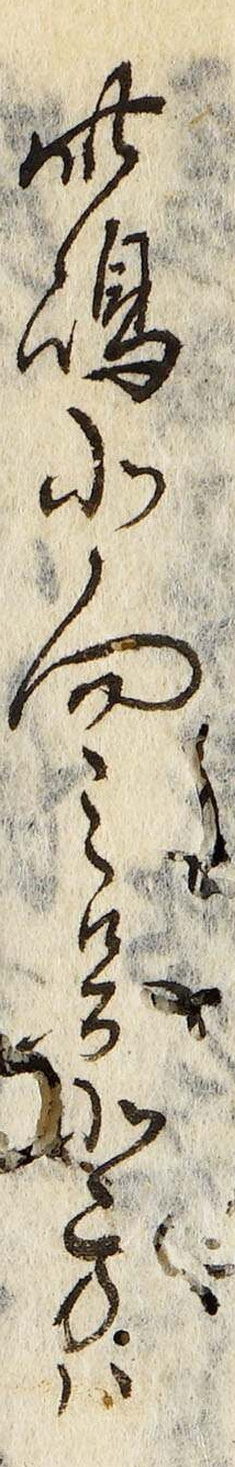此嶋北向之図北方ハ
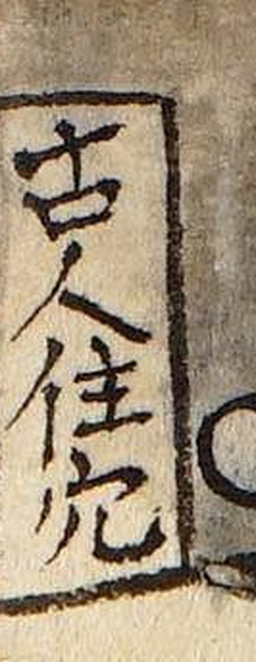古人住穴
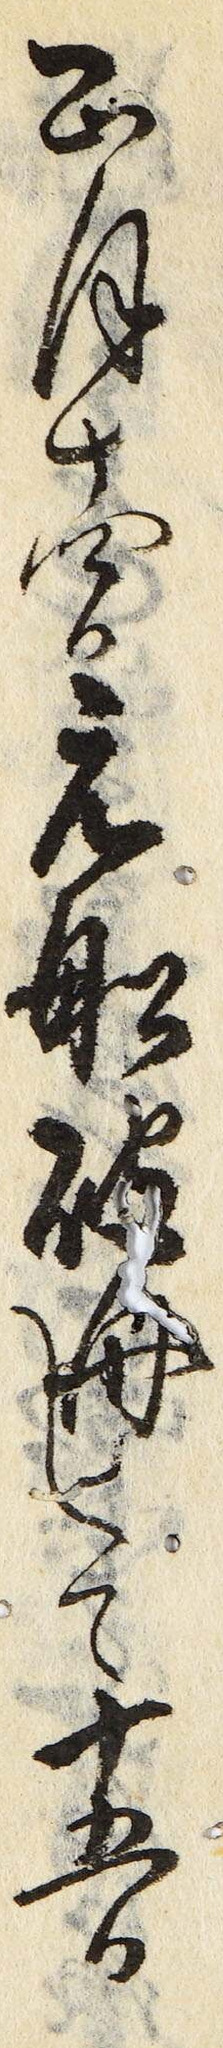正月十四日元船破舟して十五日
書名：阿波幸宝丸漂流記
